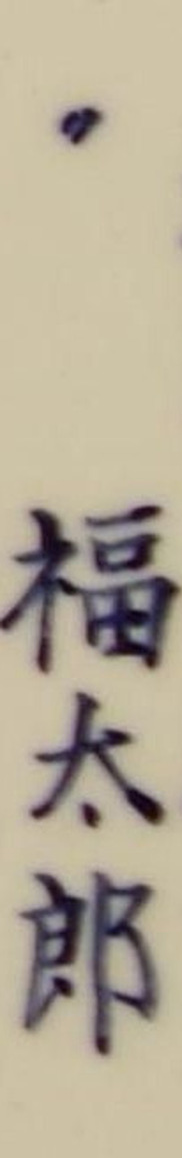福太郎
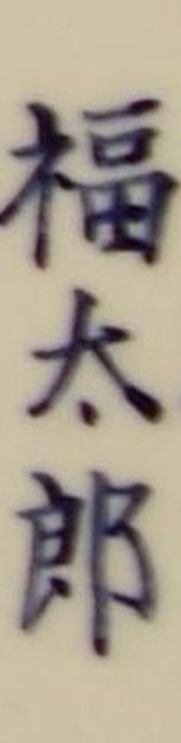福太郎
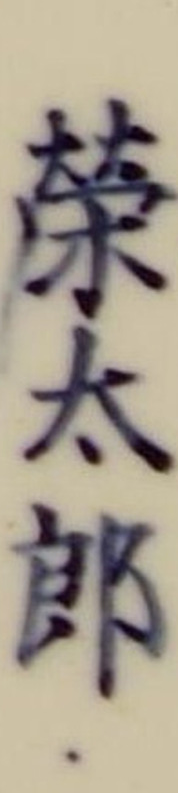榮太郎
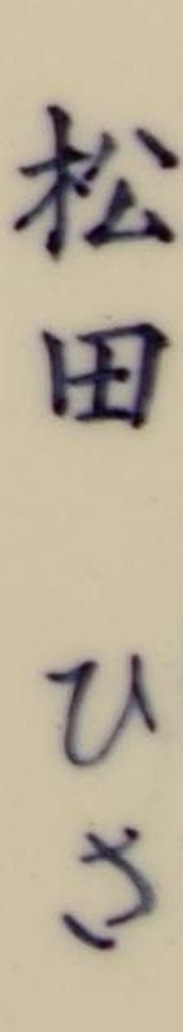松田ひさ
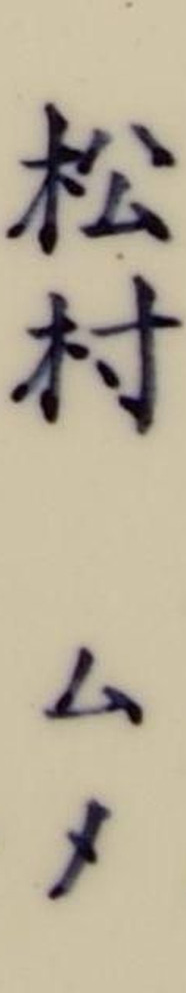松村ムメ
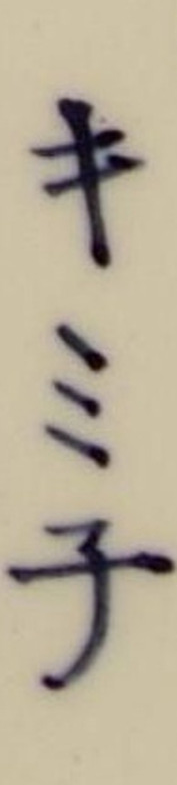キミ子
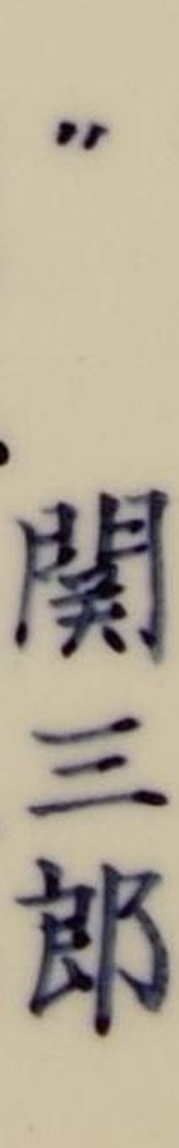関三郎
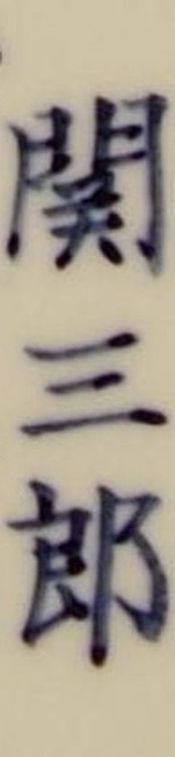関三郎
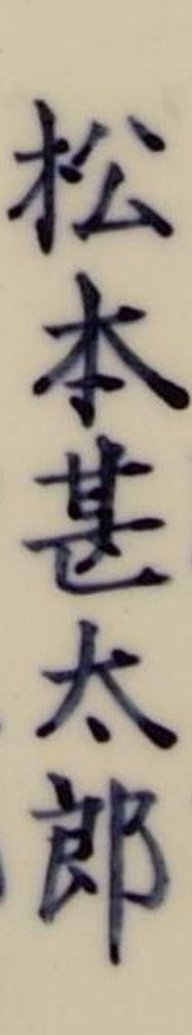松本甚太郎
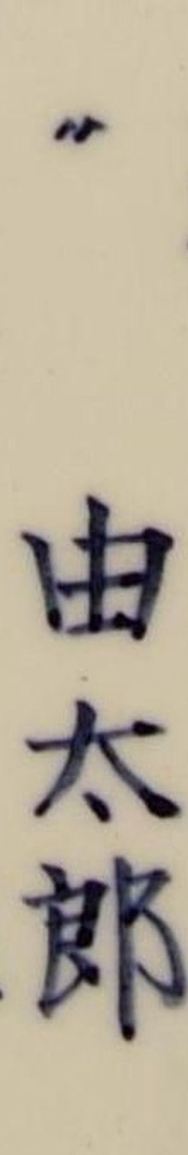由太郎
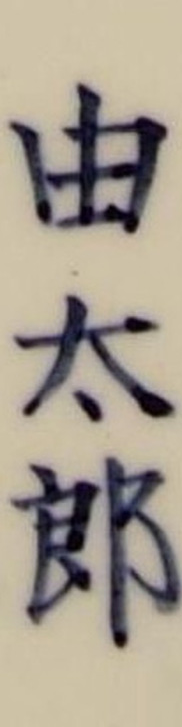由太郎
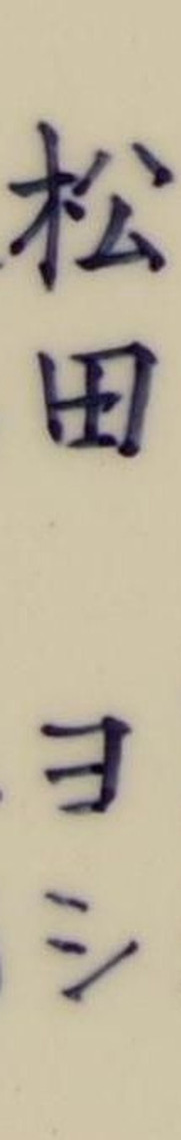松田ヨシ
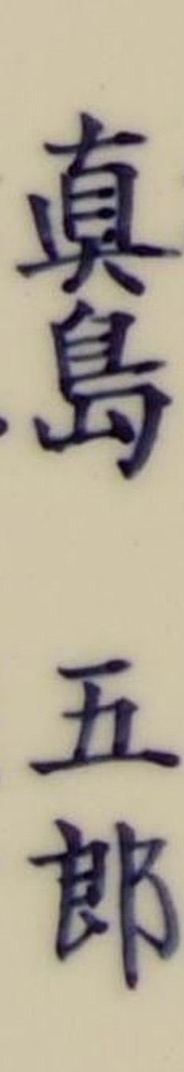真島五郎
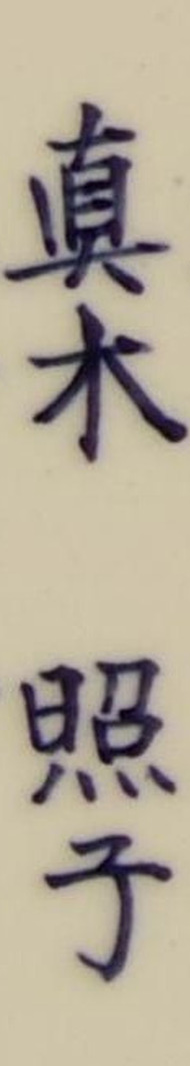真木照子
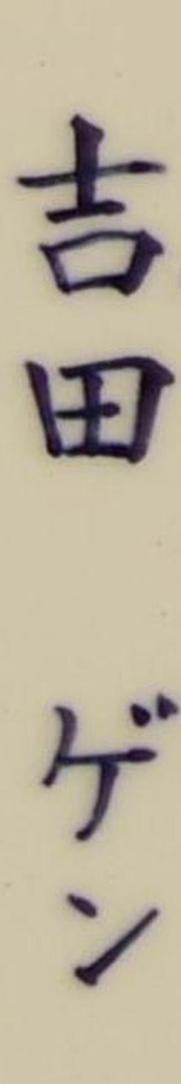吉田ゲン
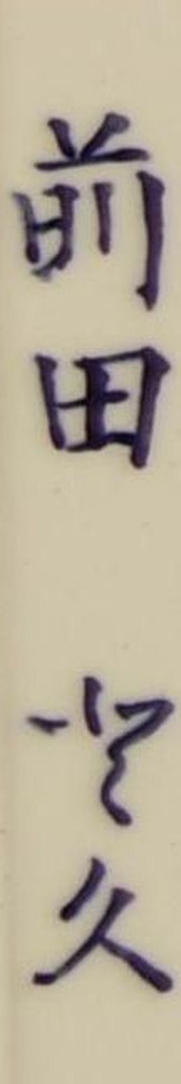前田とく
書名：E~L
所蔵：高野山金剛峯寺
